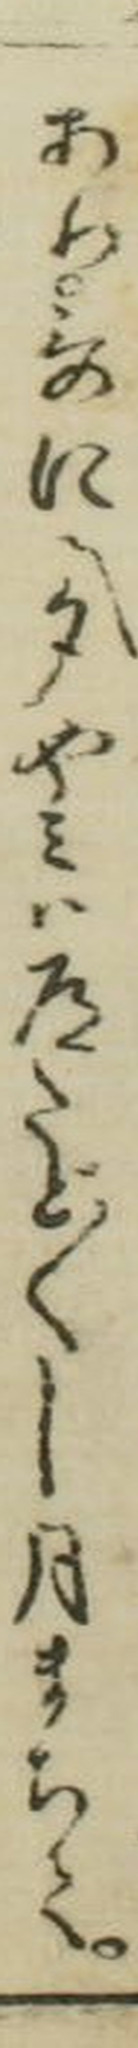あり。哥に〽夕やみは道たど〳〵し月まちて。
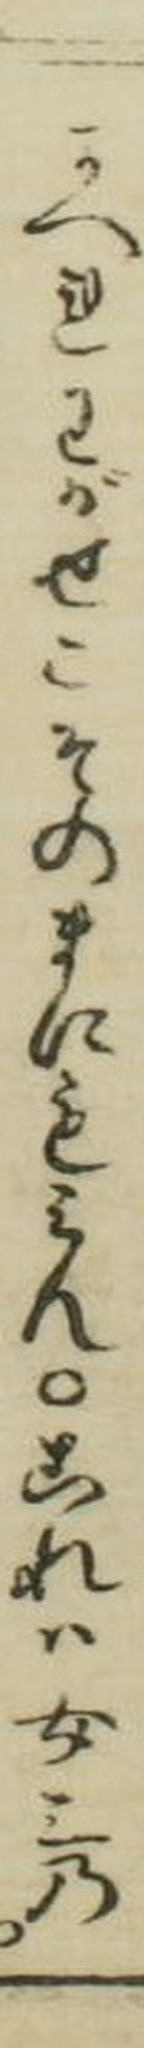かへれわがせこそのまにもみん。◯これは女三の
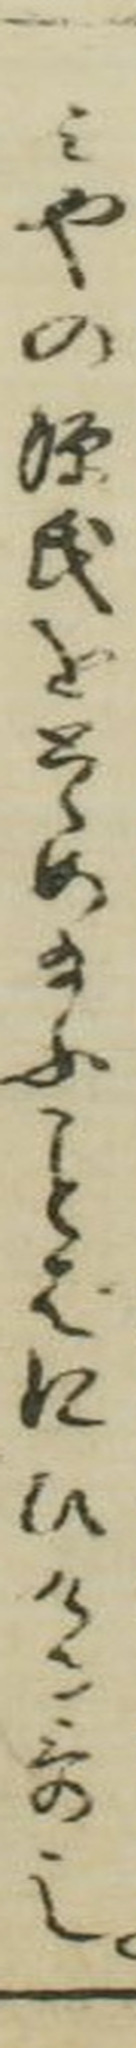みやの源氏をとゝめ給ふことばにひける哥也。
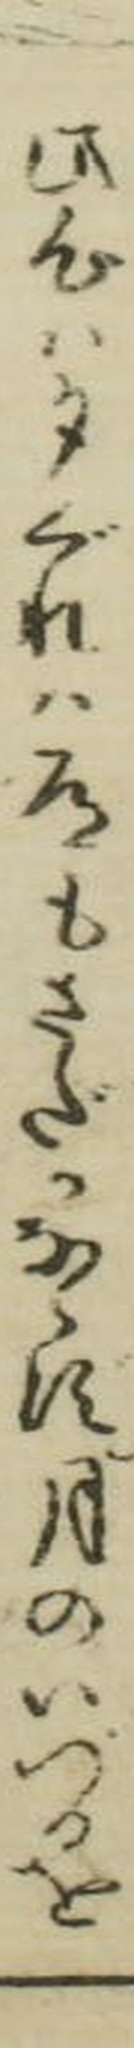此心は夕ぐれは道もさだかならず。月のいづるを
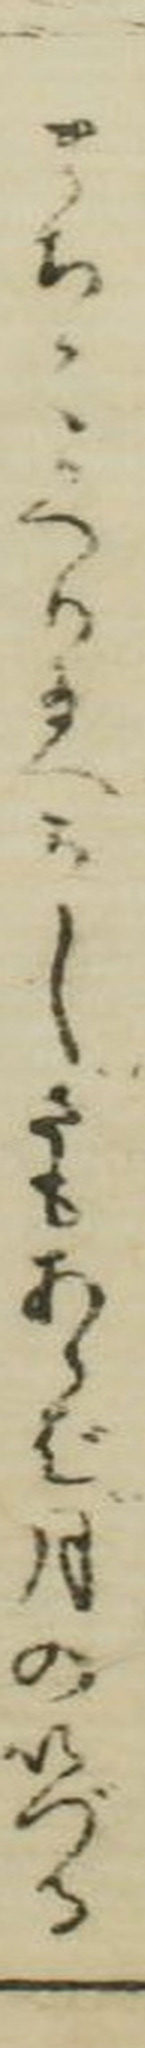まちてかへり給へかし。さもあらば。月のいづる
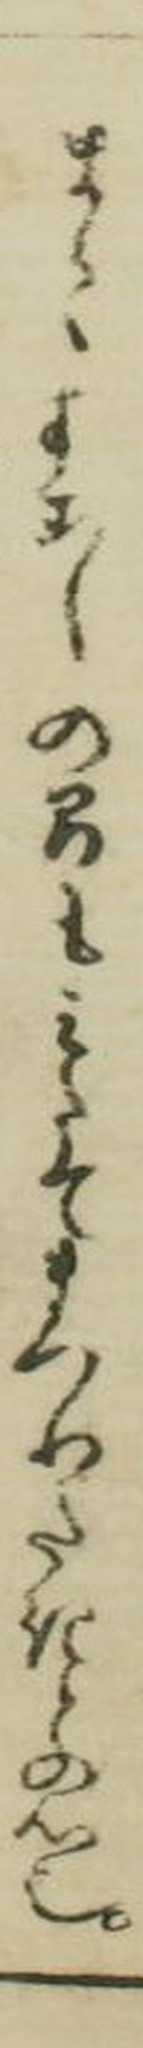まてすこしの間もみたてまつりたきとの心也。
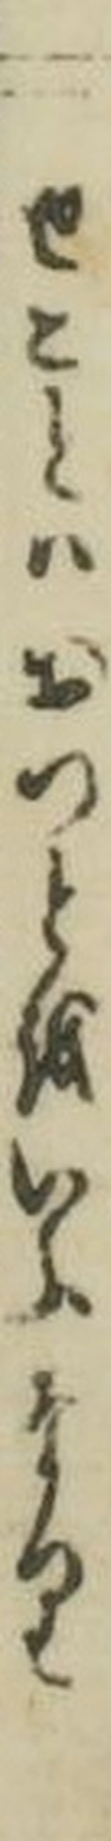せことはおつとをいふなり
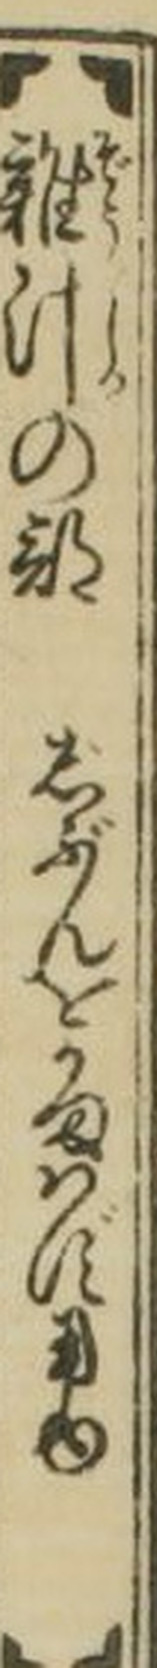雑汁の部しぶんをかまはず用ゆ
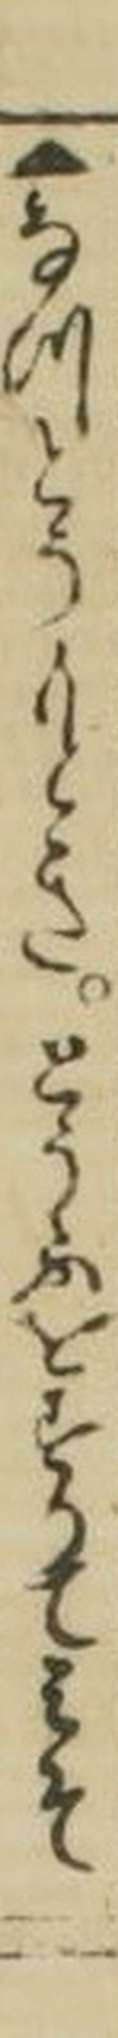▲なつとうもとき。とうふをすりてみそ
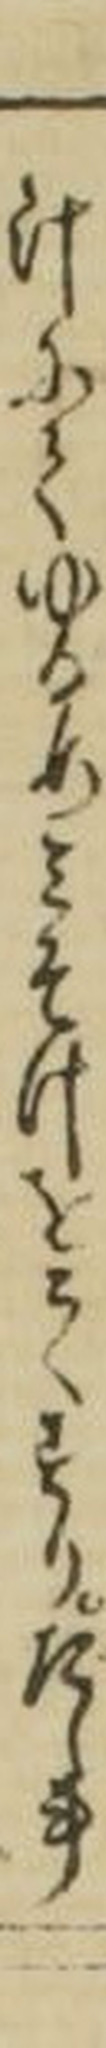汁にてゆるめみそ汁をこくすり。だし計
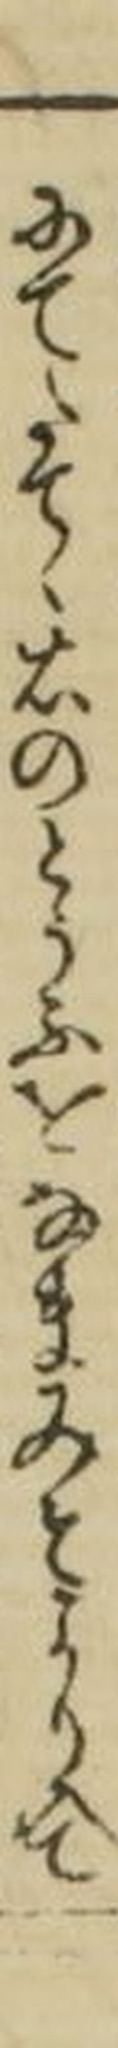にてたてゝ右のとうふをなまみそより入て
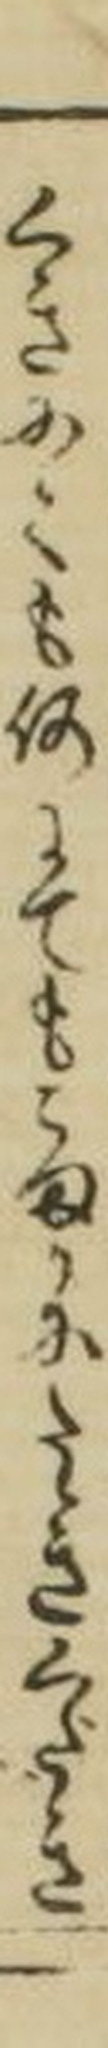くきにても何にてもこまかにたゝきくだき
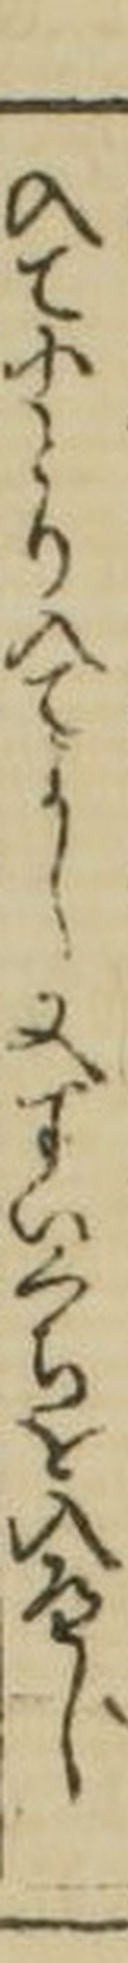入て小とり入てよし又すいくちを入へし
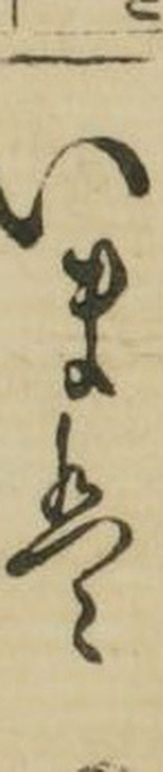いまは
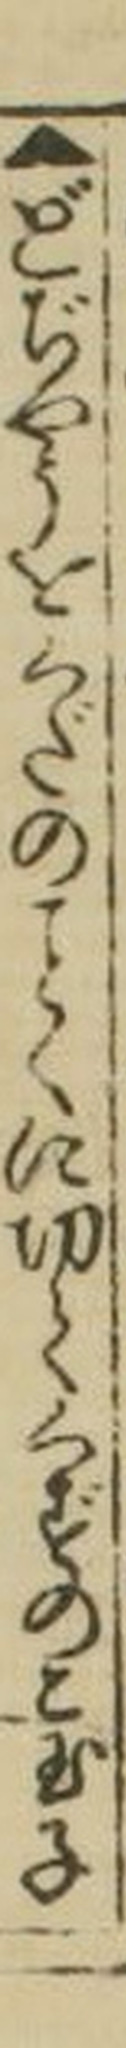▲どぢやうをくだのことくに切てくずのこ玉子
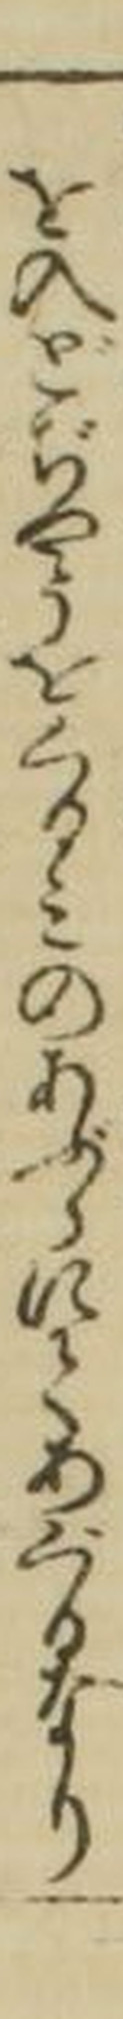を入どぢやうをくるみのあぶらにてあぐるなり
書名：女源氏教訓鑑
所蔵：東京学芸大学附属図書館
